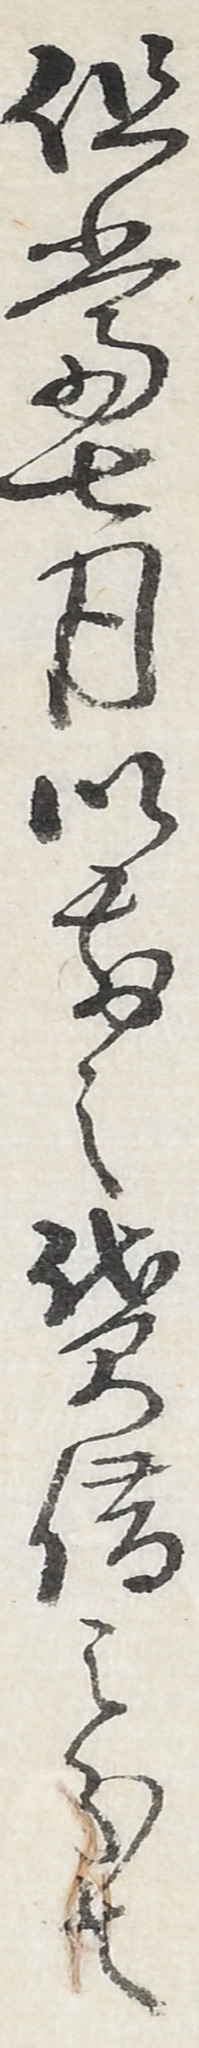但当七月以前之貸借之分は
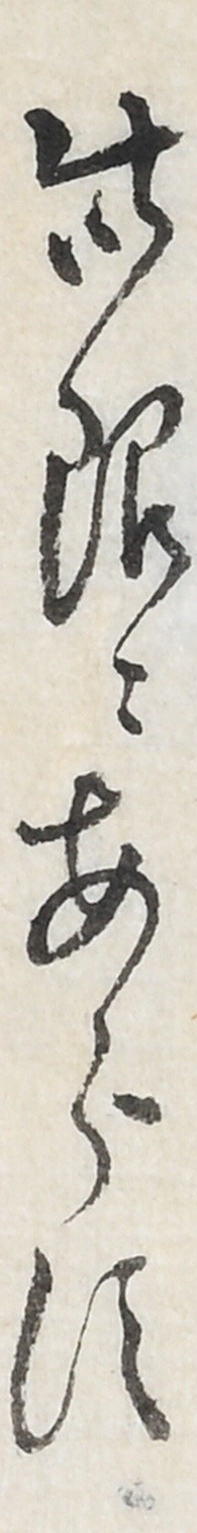此限ニあらす
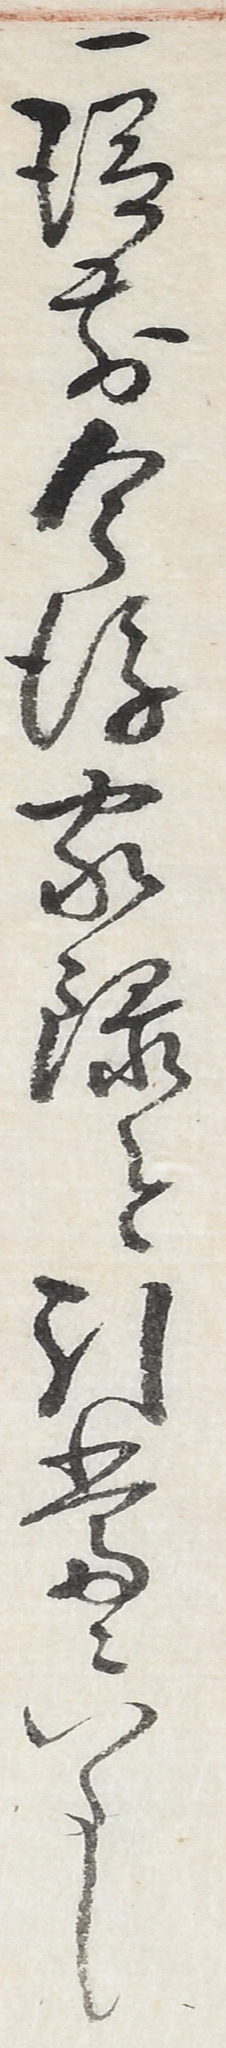一従前今後家禄と引当ニいたし
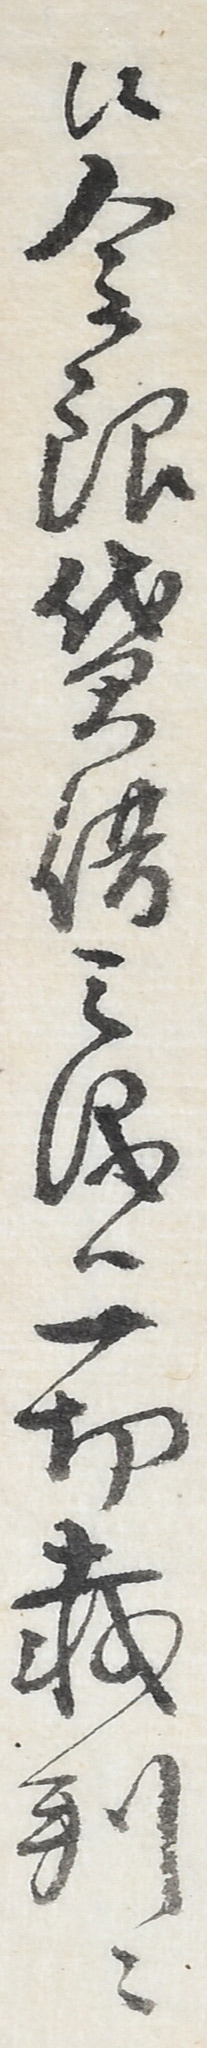候金銀貸借之儀ハ一切裁判ニ
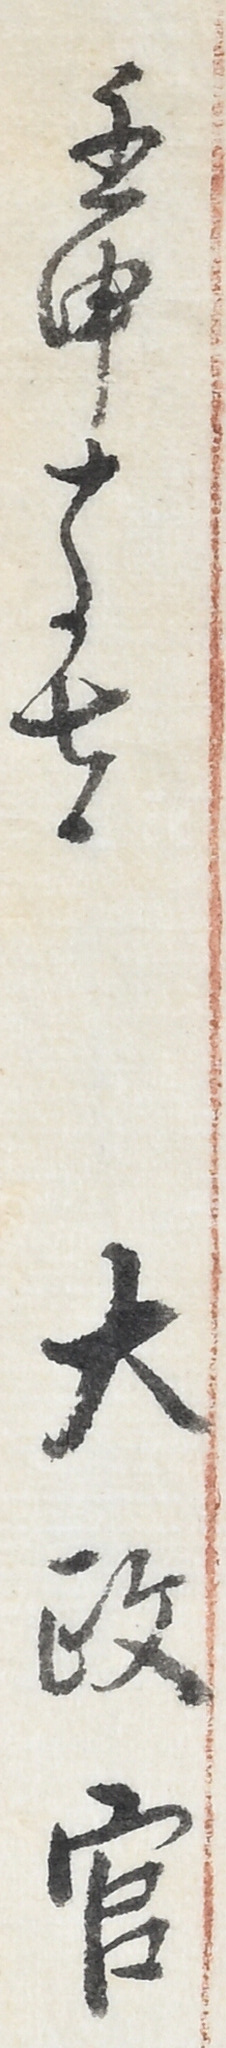壬申十月七日大政官

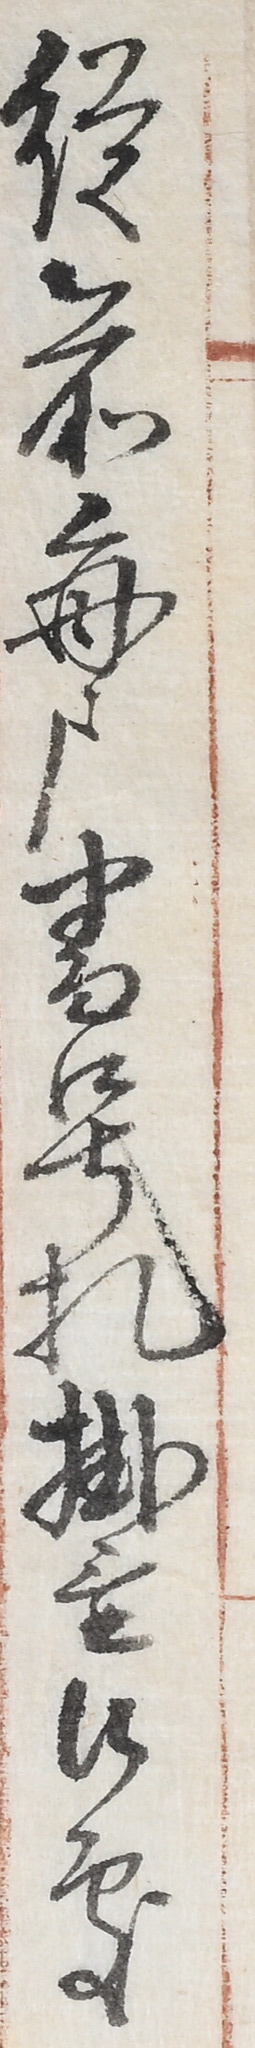従前毎戸番号札掛置候処
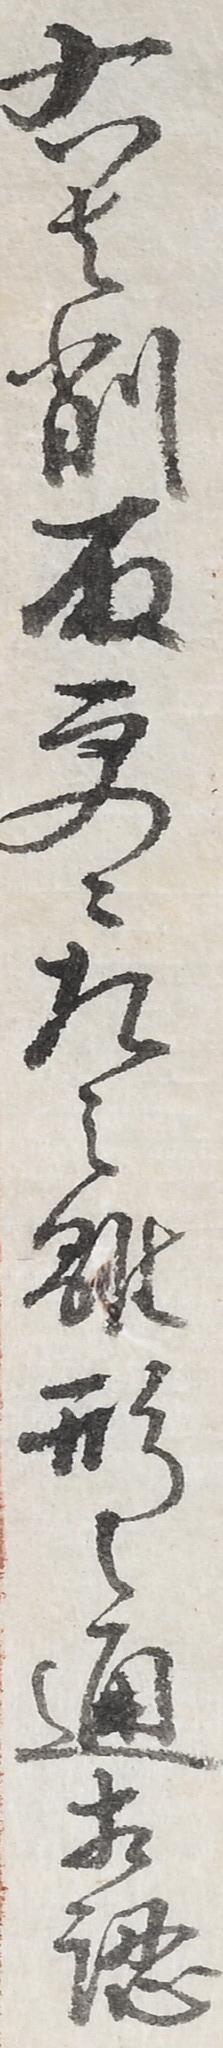右は削取更に左之雛形之通相認
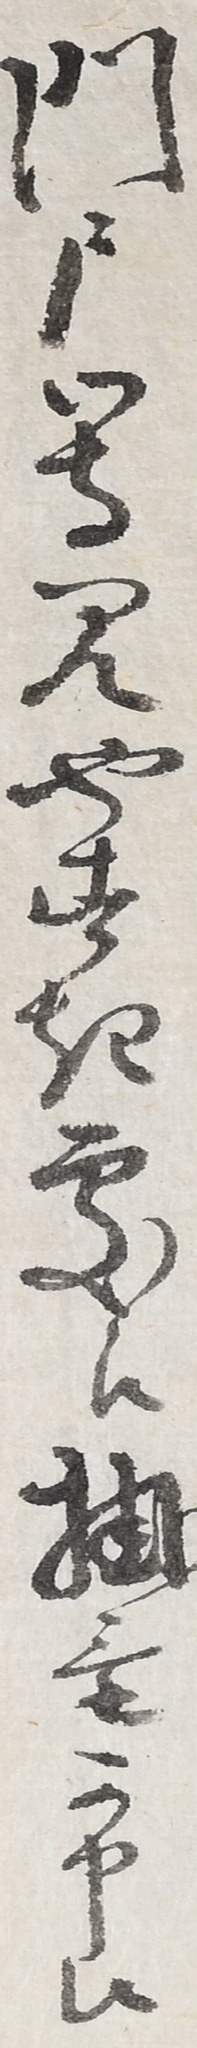門戸等見やすき所え掛置可申候
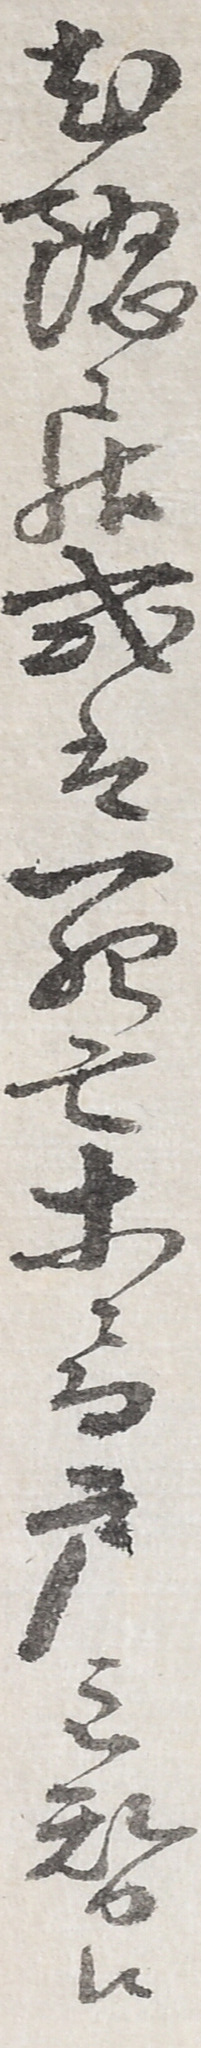尤隠居或は死亡等にて戸主替候
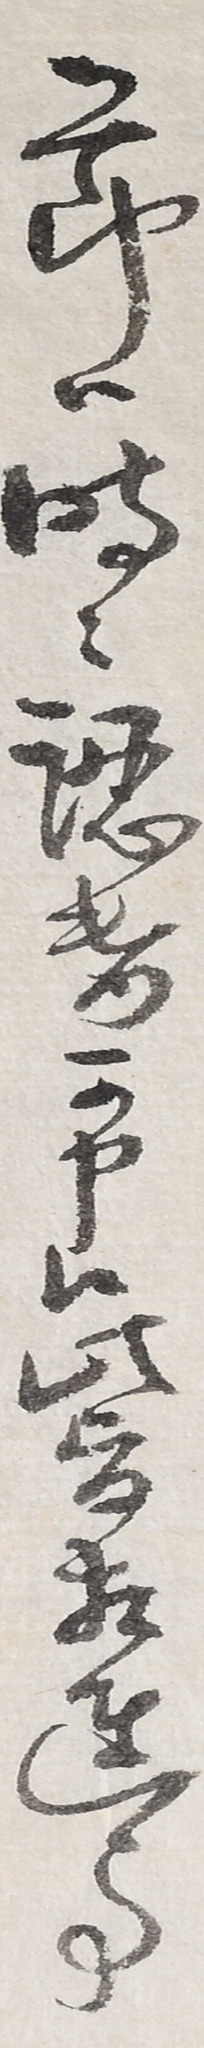節は時々認替可申候此旨相達事
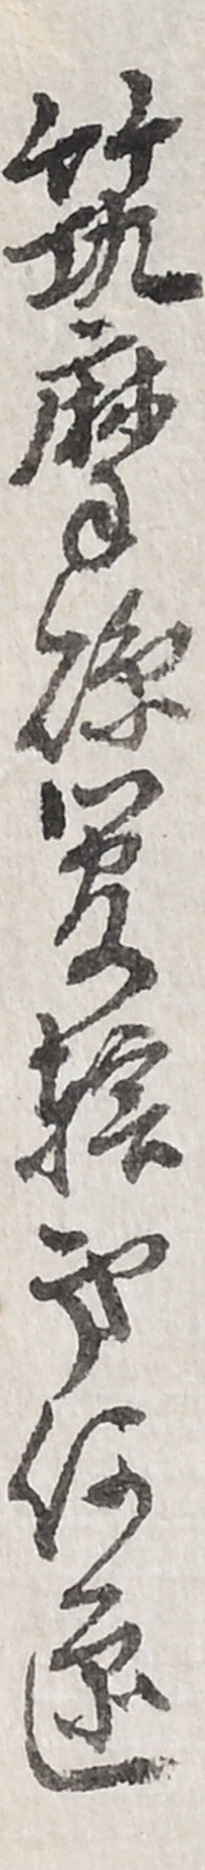筑摩県管轄第何区
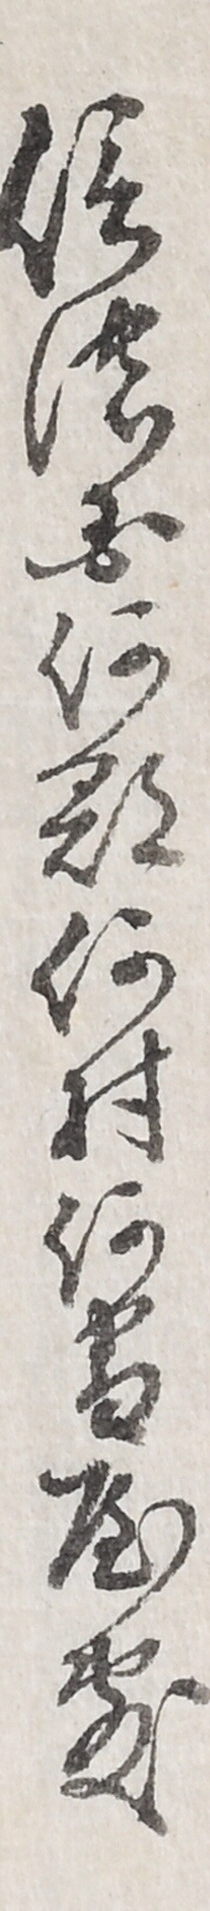雛信濃国何郡何村何番屋敷
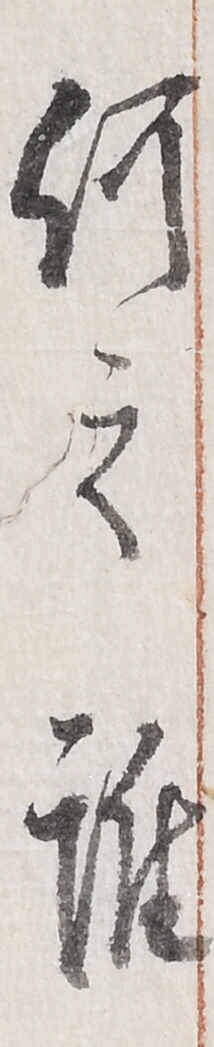何之誰
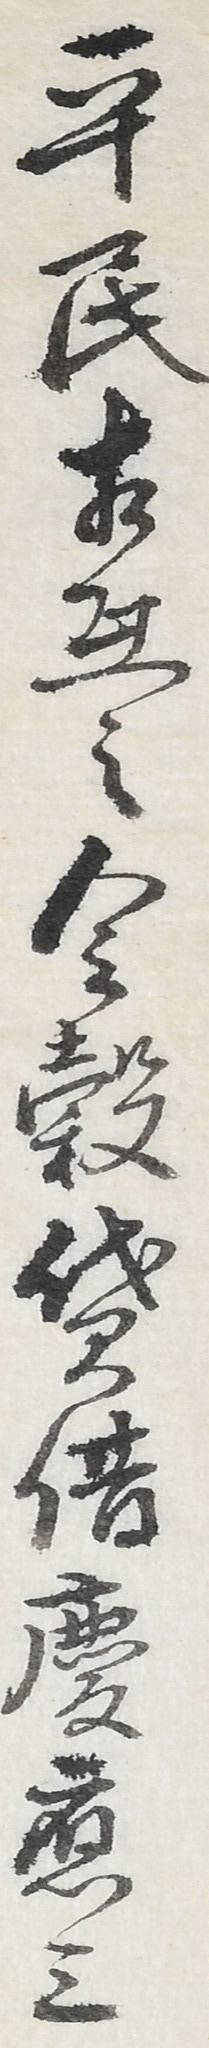平民相互之金穀貸借慶応三
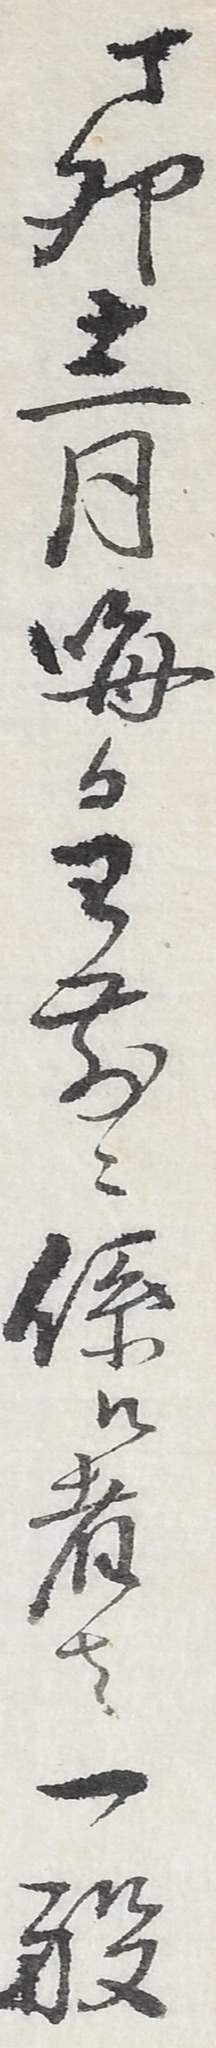丁卯十二月晦日已前ニ係ル者は一般
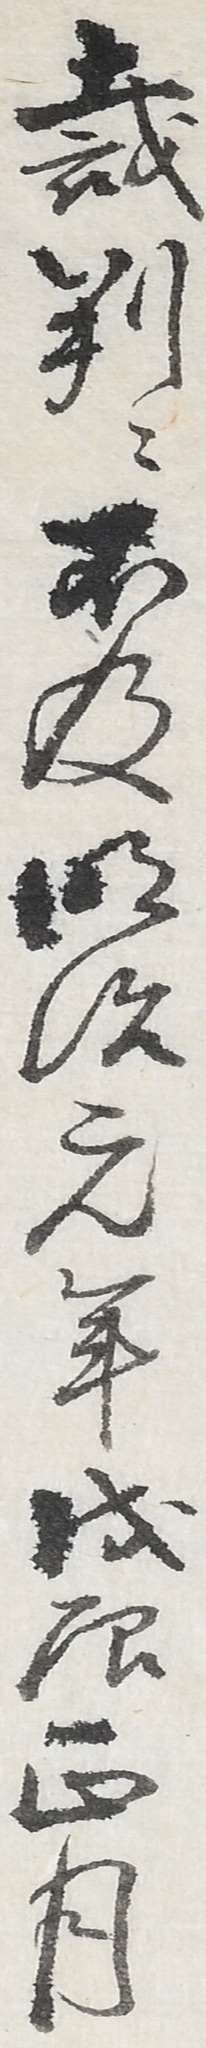裁判ニ不及明治元年戊辰正月
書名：壹番・御布告一式
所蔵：伊那市立高遠町図書館・合同会社AMANE
